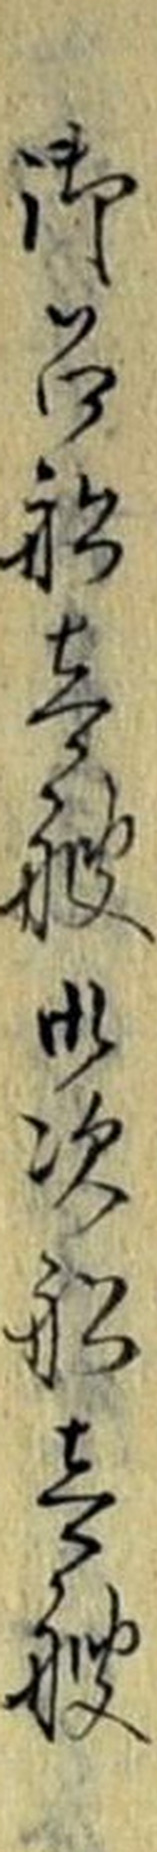御召船壱艘御次船壱艘
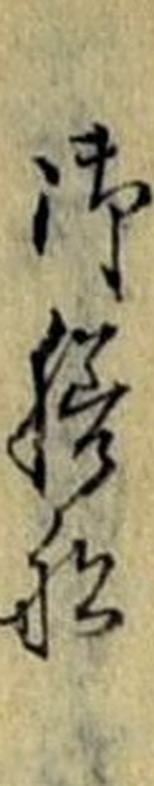御膳船
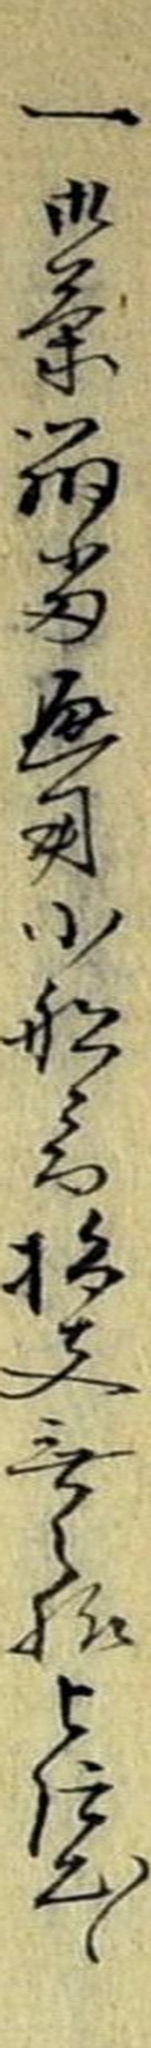一御茶部弁当通用小船に而指支無之様被仰出候
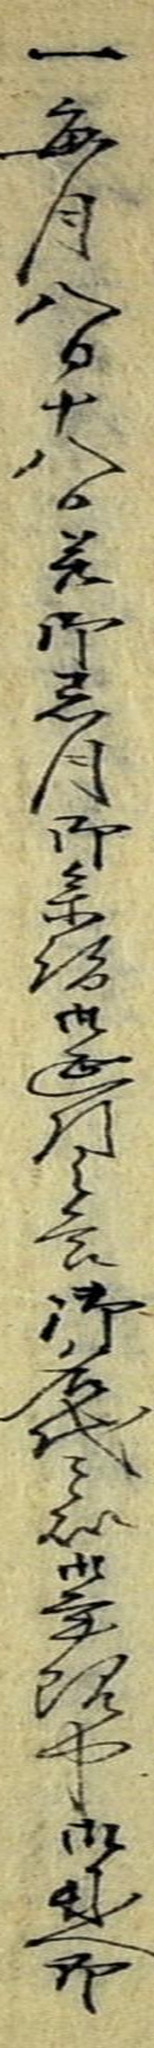一毎月八日十八日并御忌月御参詣御延引之節御名代に候処御年限中御用人御
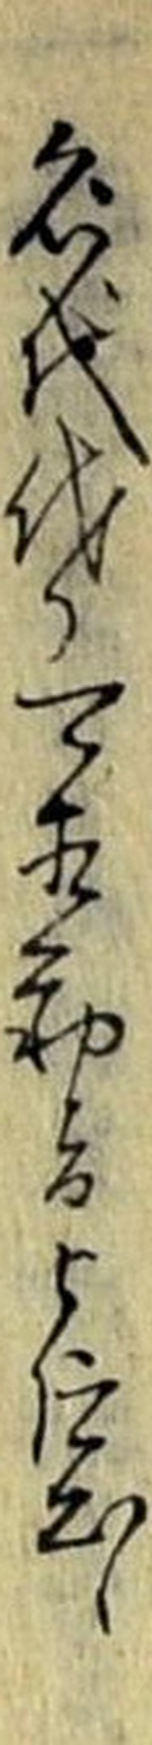名代代り可相勤旨被仰出候
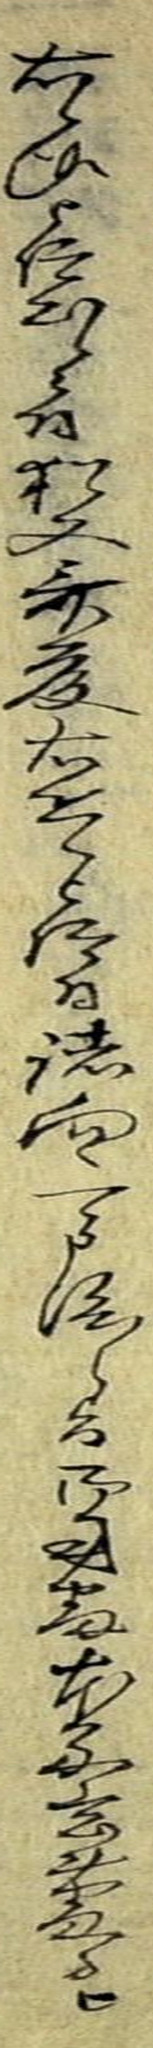右之趣被仰出候に付猶又斉藤右近へ被仰付諸向へ可申渡候旨御用番本多玄蕃方被
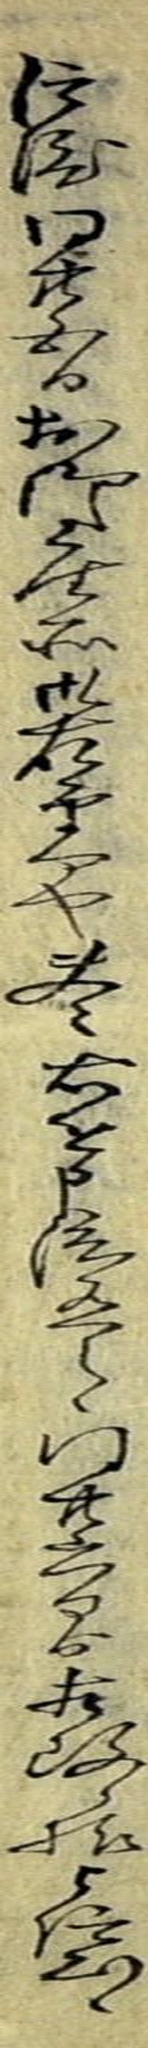仰渡同廿五日於御座所御右筆部屋夫々右近申渡有之候同廿六日ゟ相改候様被仰出候
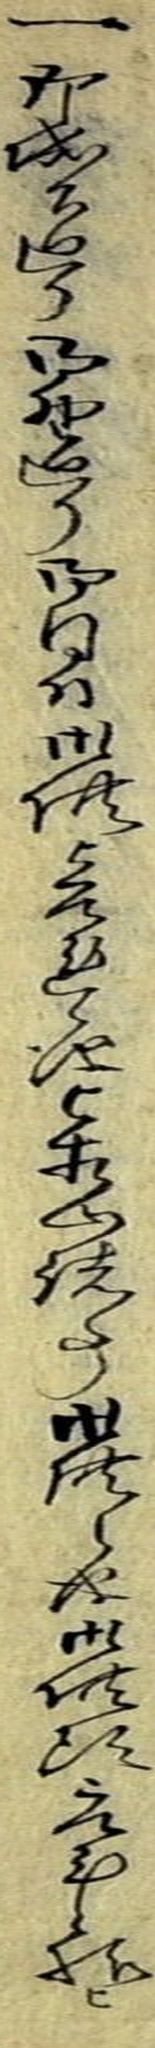一御城下廻り御野廻り御目付御供被召連候儀被相止諸事御供之儀御供頭取斗候様被
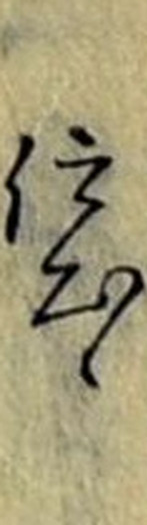仰出候
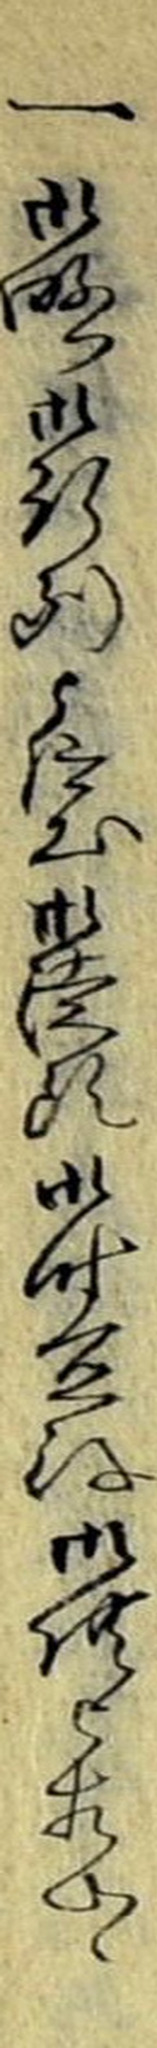一御略御行列被仰出御徒頭御時宜役御供被相止候
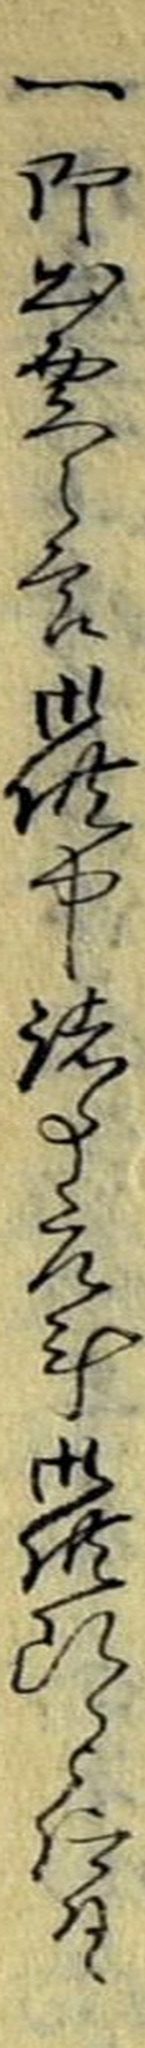一御出殿之節御供中諸事取斗御供頭へ被仰付候

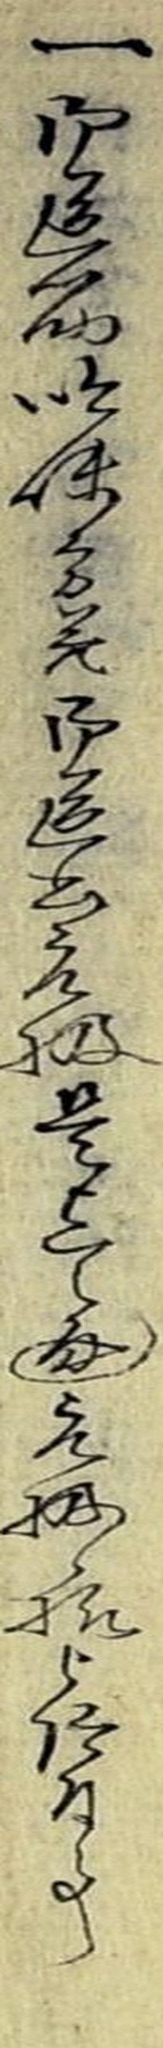一御道筋吟味方并御道書取扱是迄之通取扱候様被仰付候事
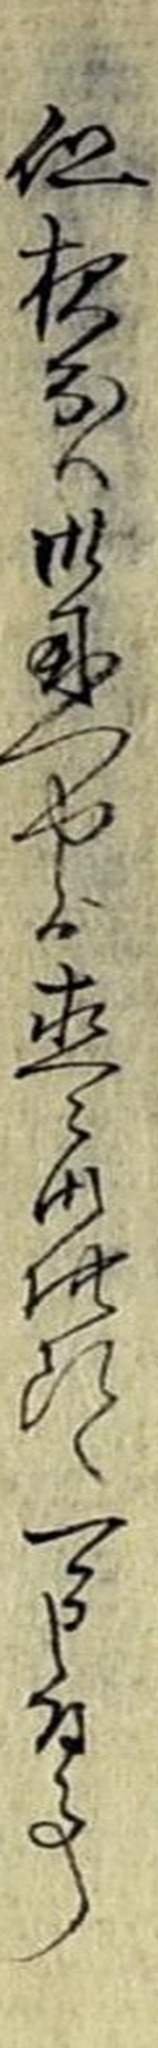但夜分は御用人中ゟ直々御供頭へ可申付事
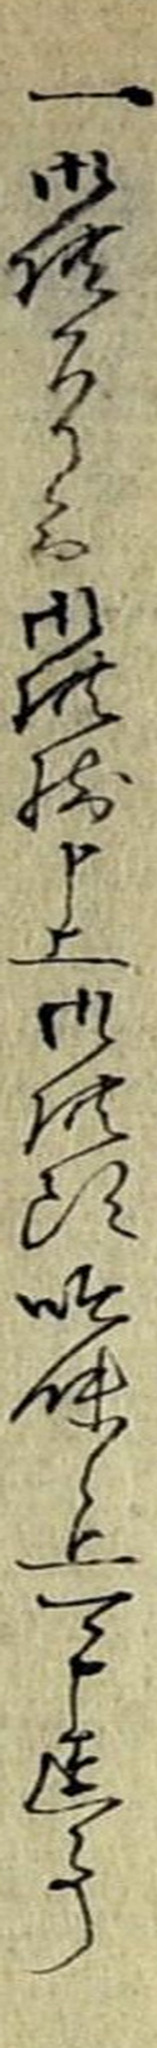一御供下りに而御供揃申上御供頭吟味之上可申達事
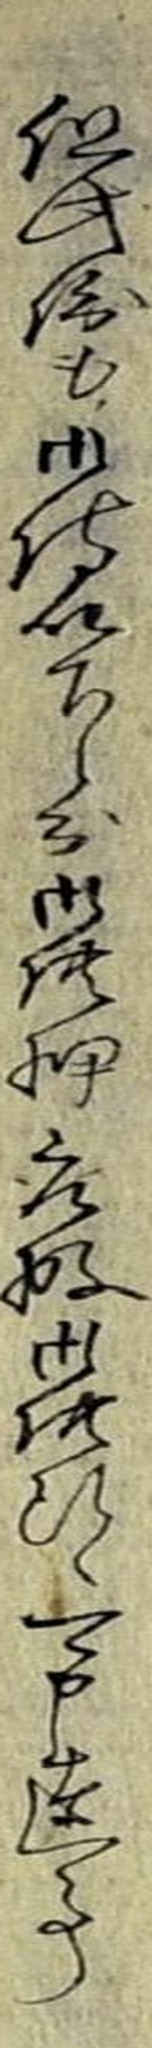但此儀も御侍以可之分御供押取扱御供頭へ可申達事
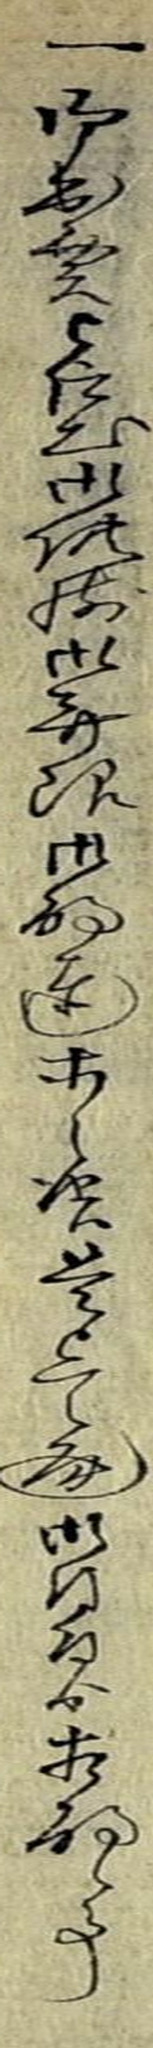一御出殿被仰出御供揃御刻限御触達等之儀は是迄之通御目付ゟ相触候事
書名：命令之部 四
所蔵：福井県文書館 Fukui Prefectural Archives
